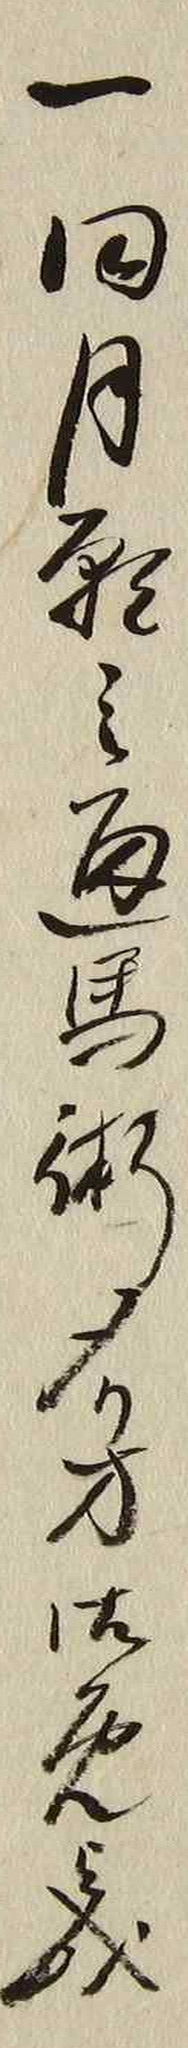一同月願之通馬術〆り方御免被成
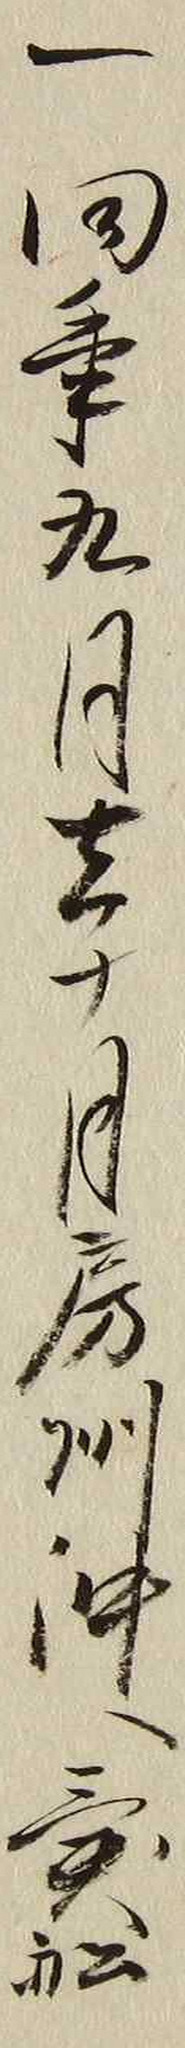一同年九月去十月房州沖異船
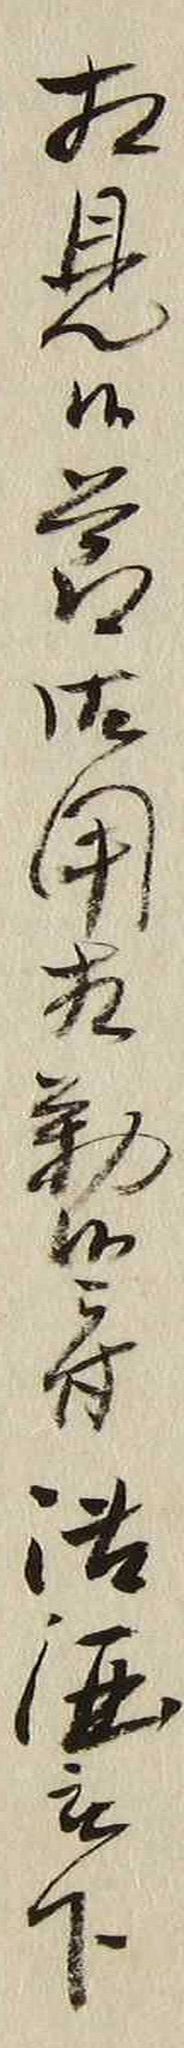相見候節御用相勤候付御酒被下
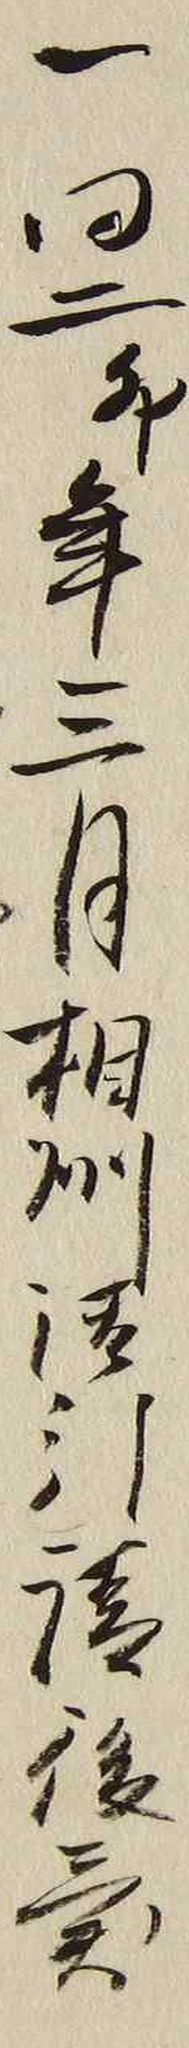一同二卯年三月相州御引請後異
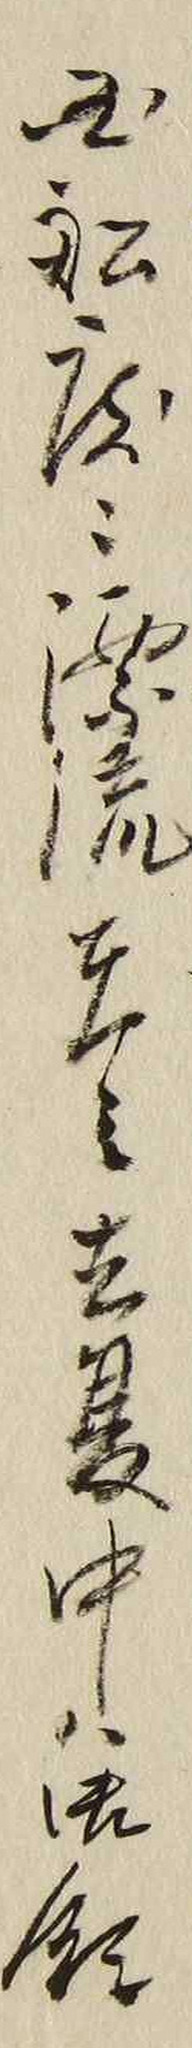国船度々漂流在之去夏中ハ御領

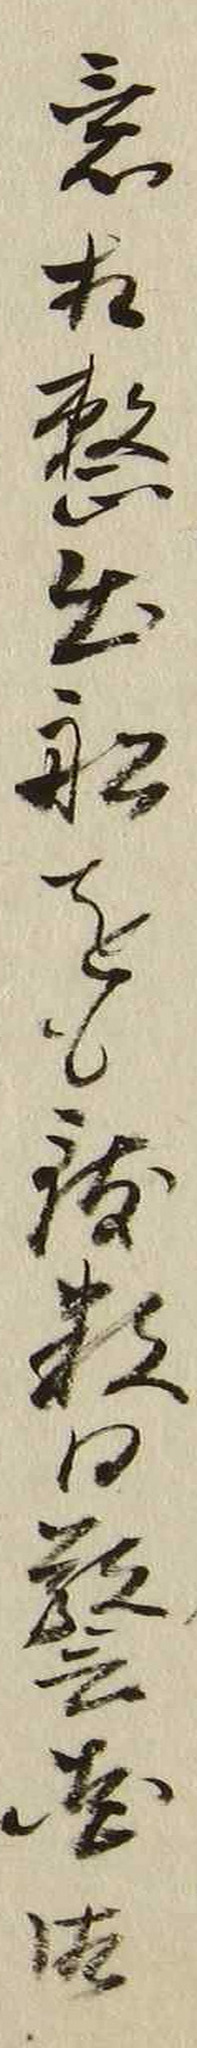意相整出船をも致数日警固御
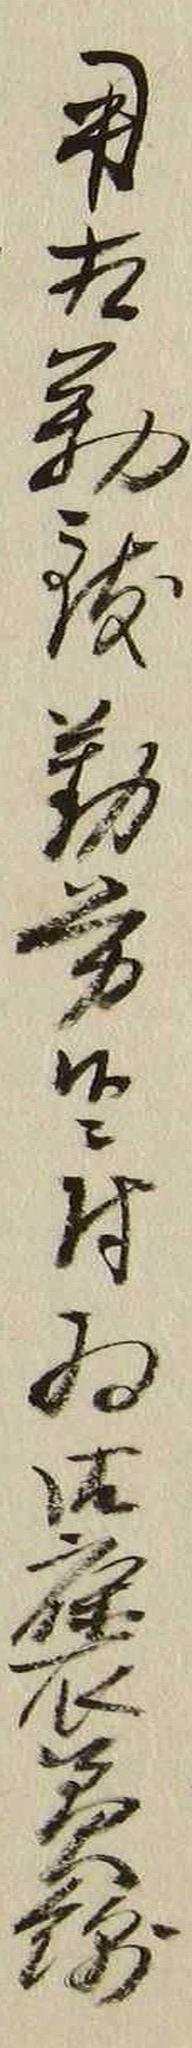用相勤致勤労候付為御褒美綿
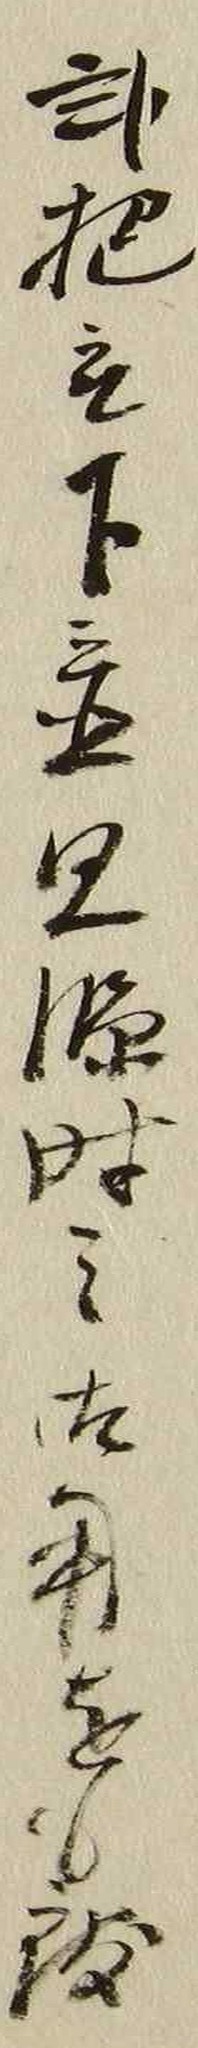弐杷被下置且臨時之御用をも致
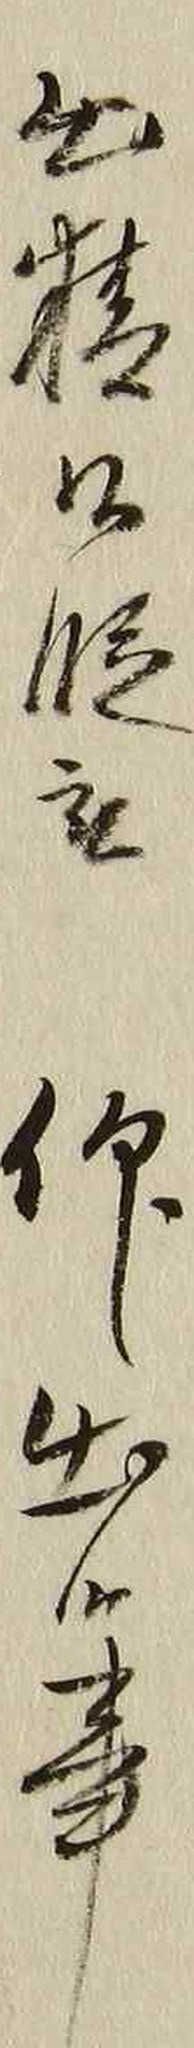出精候段被仰出候事
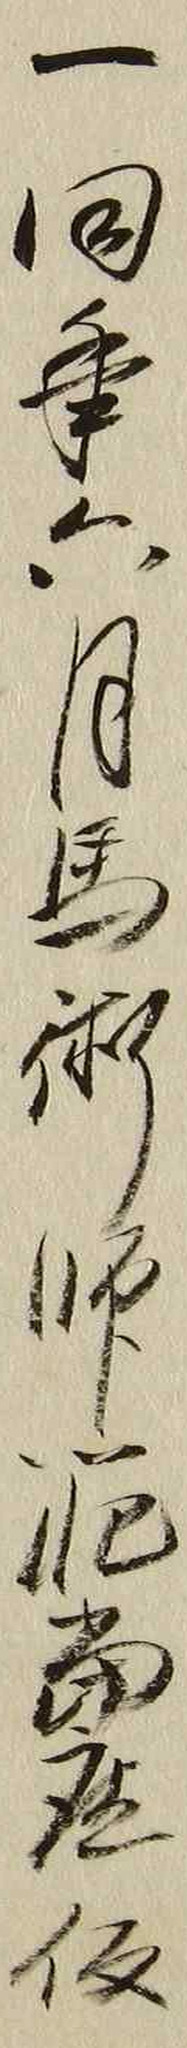一同年六月馬術師範当座仮
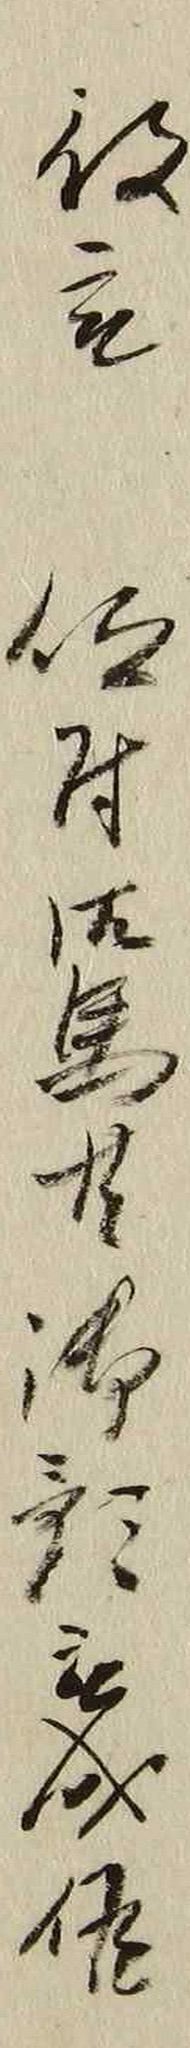役被仰付御馬共御預被成候
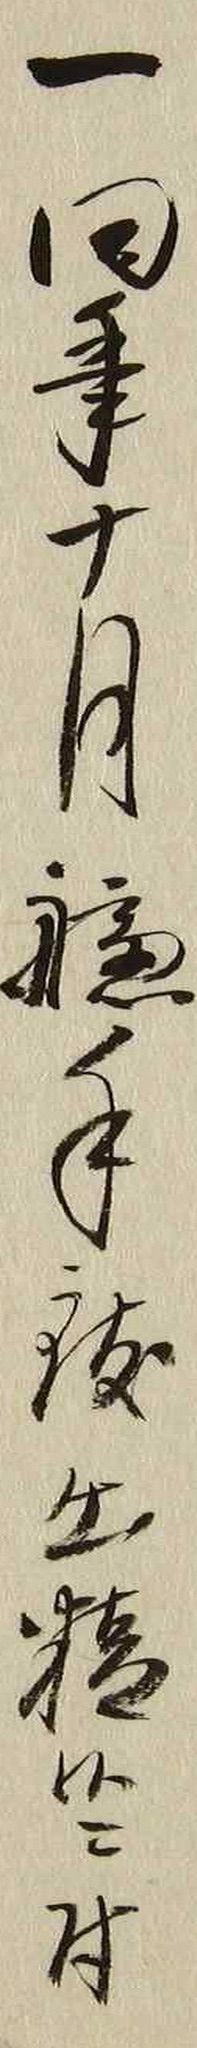一同年十月手致出精候付
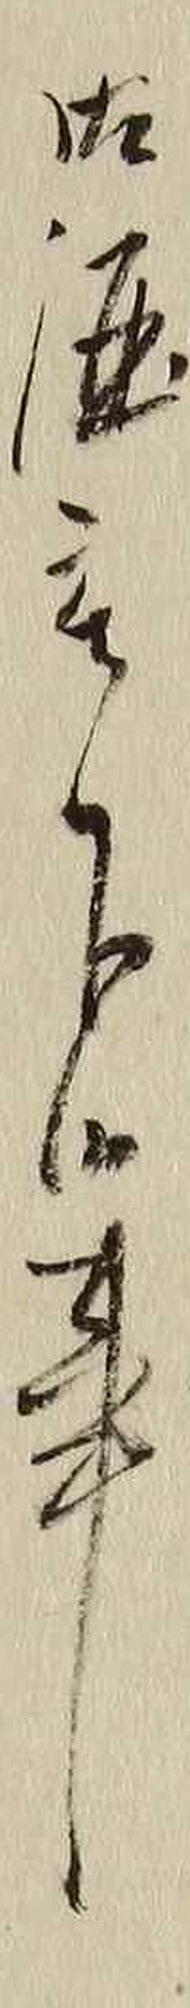御酒被下候事
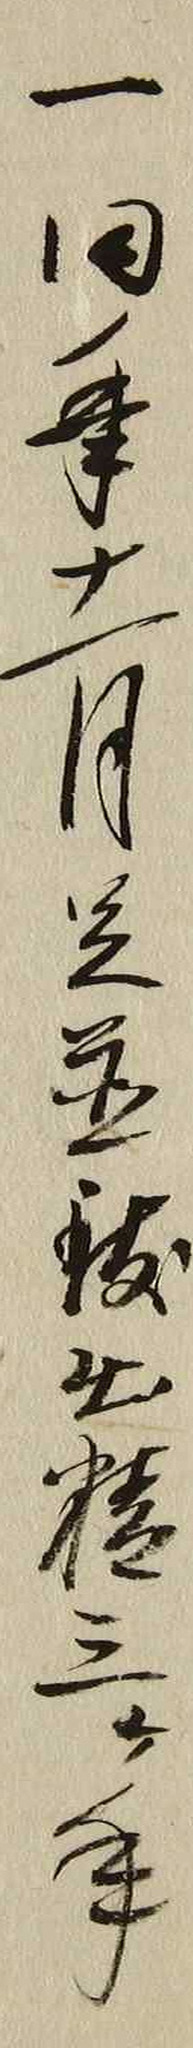一同年十一月一足並致出精三年
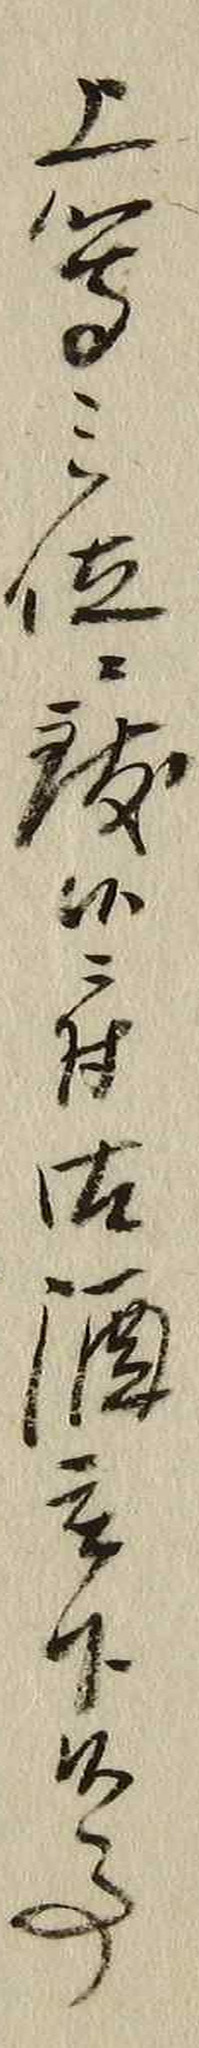上等之位致候付御酒被下候事
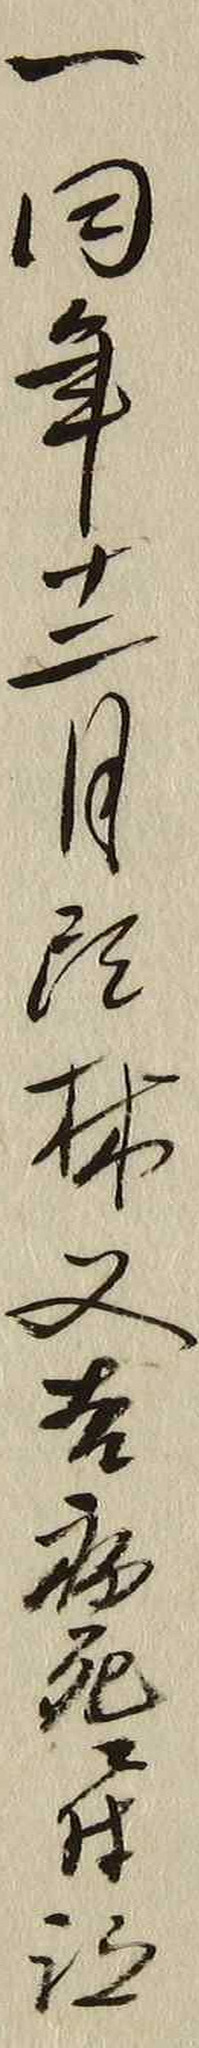一同年十二月頭林又吉病死付跡
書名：諸士系譜　巻之350　せ之部1冊全
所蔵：会津若松市立会津図書館
